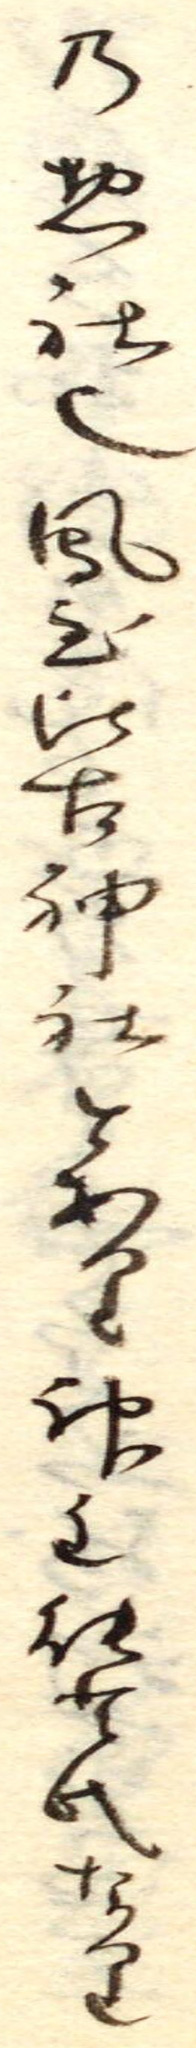の惣社也鳳至比古神社とあり神主能登氏なり
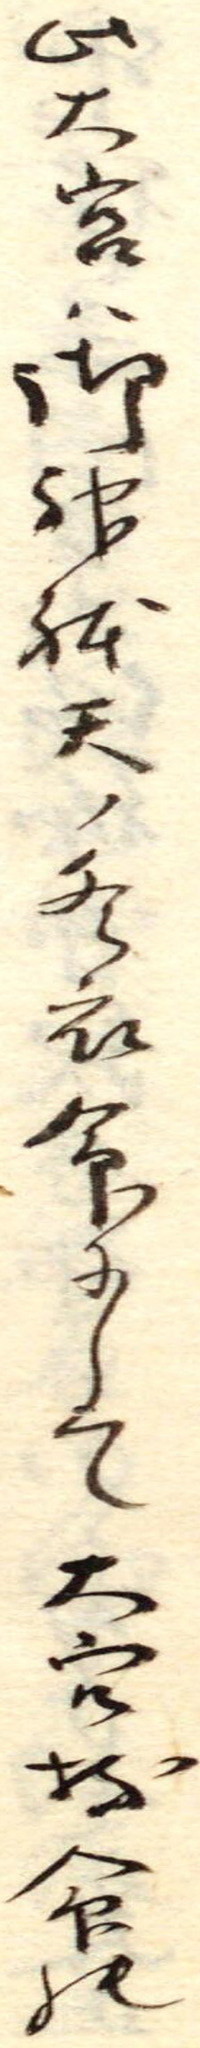此大宮は御神躰天ノ冬衣命にて大穴持命の
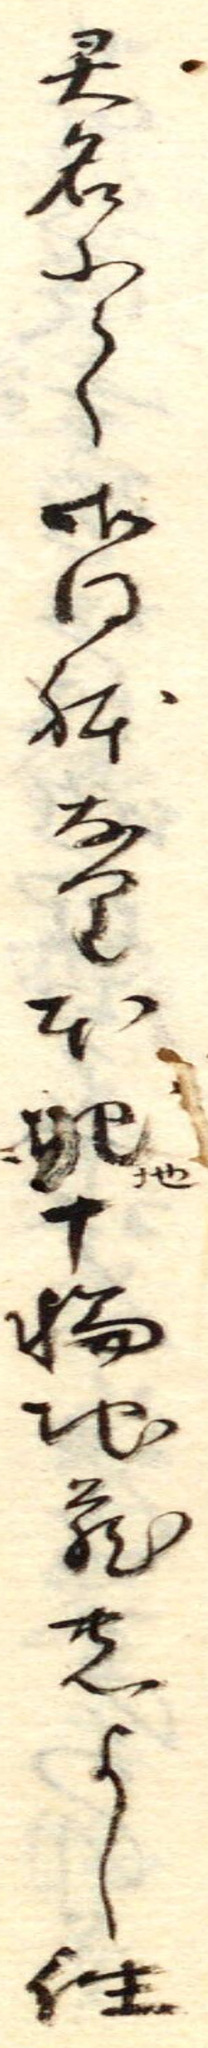異名にて御同躰なり本圯地十輪地蔵のよし往
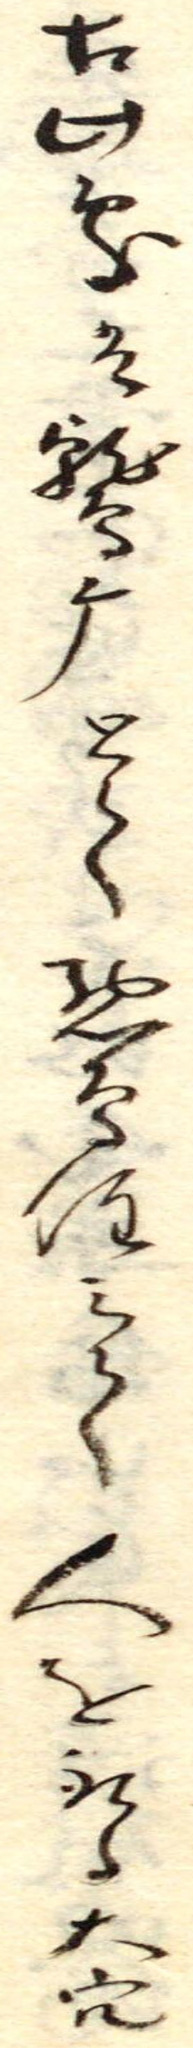古此処は鷲魔とて悪鳥住みて人を取る大穴
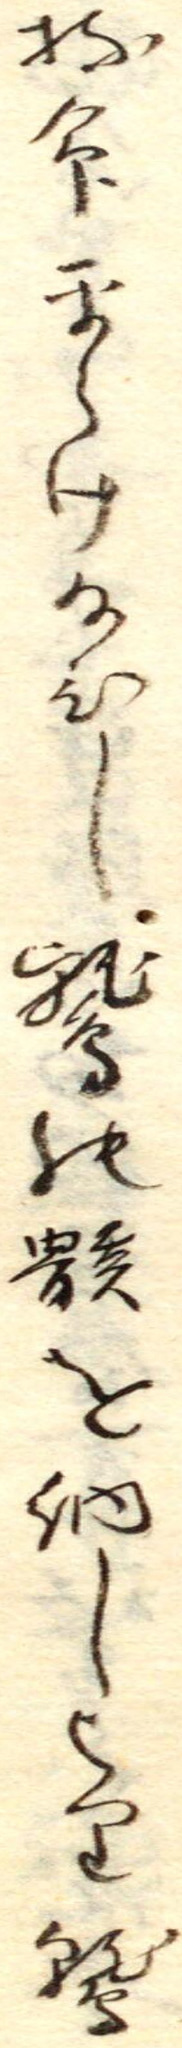持命は平らけ給ひし。鷲の骸を納しより鷲
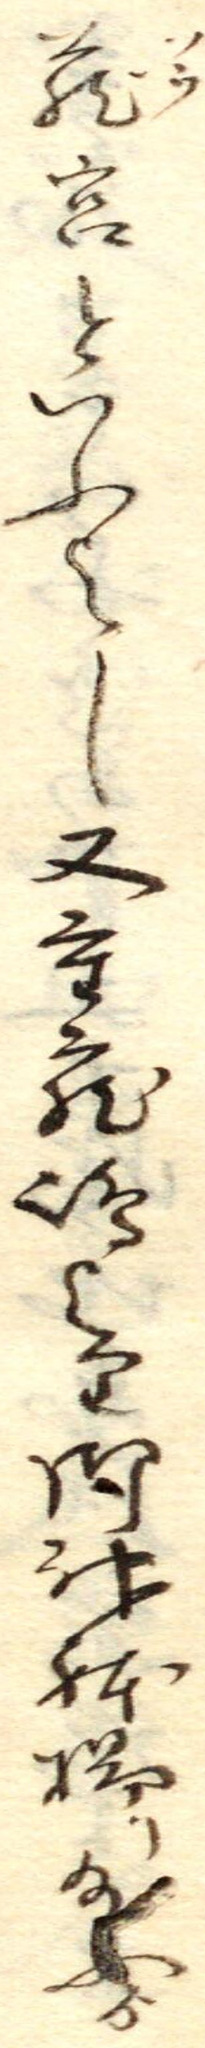蔵宮といふよし又重蔵嶋より御神躰揚り給ふゟ

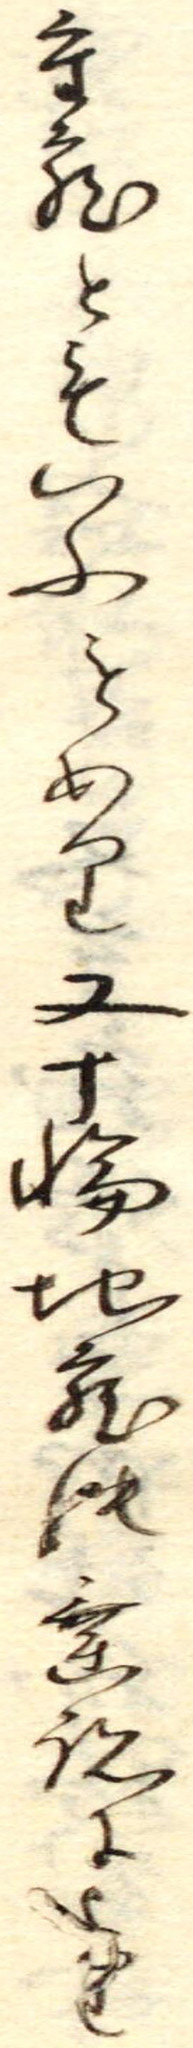重蔵ともいふとあり又十輪地蔵の垂跡により
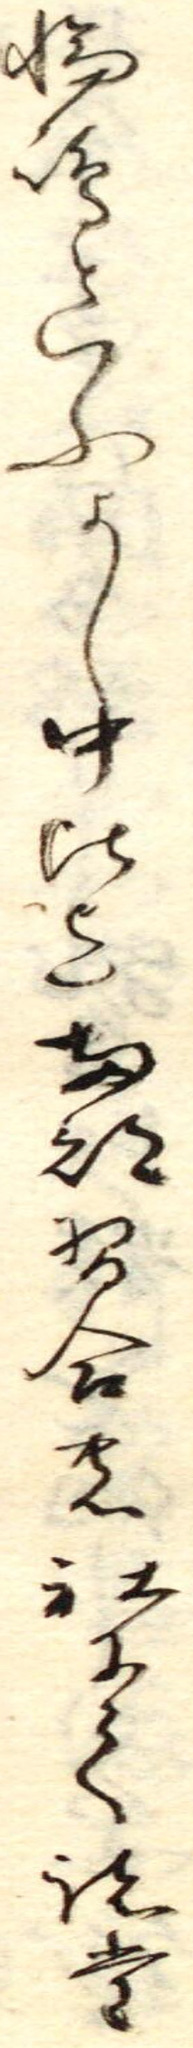輪嶋といふよし中比迄両部習合の社にて諸堂
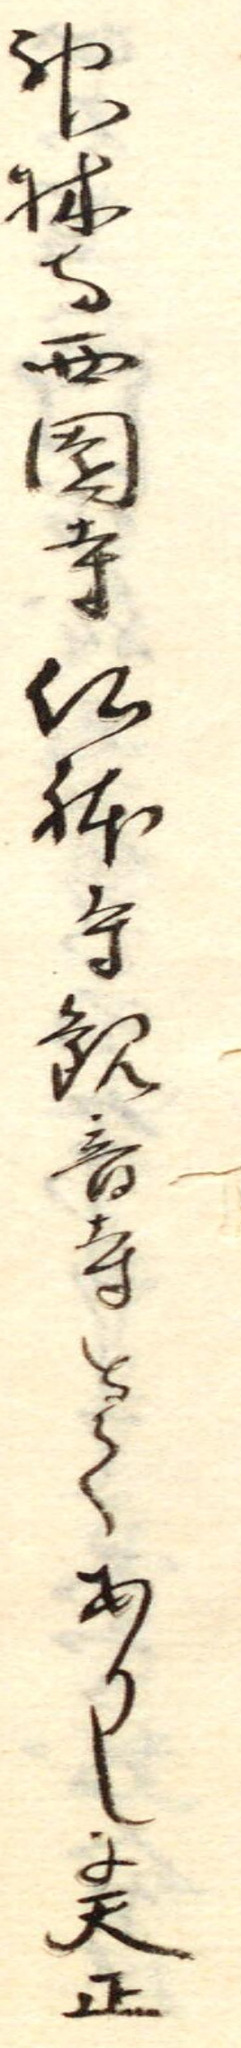神林寺西園寺仏躰寺観音寺とてありしに天正
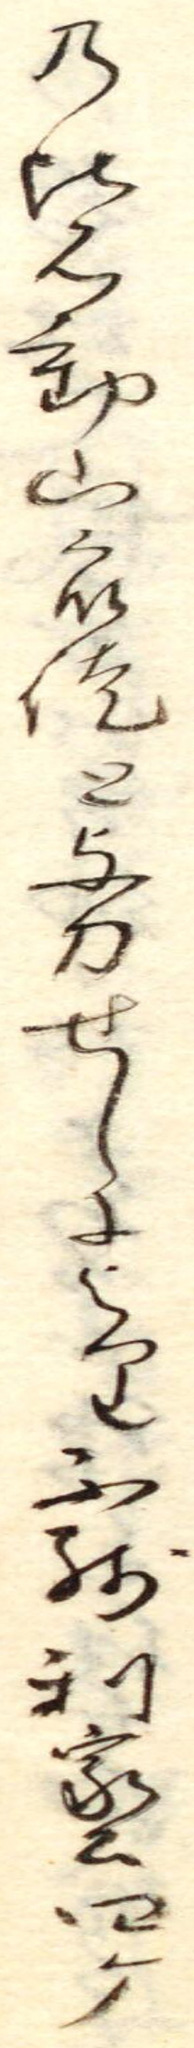の比石動山衆徒と与力せしにより不残利家公四ヶ
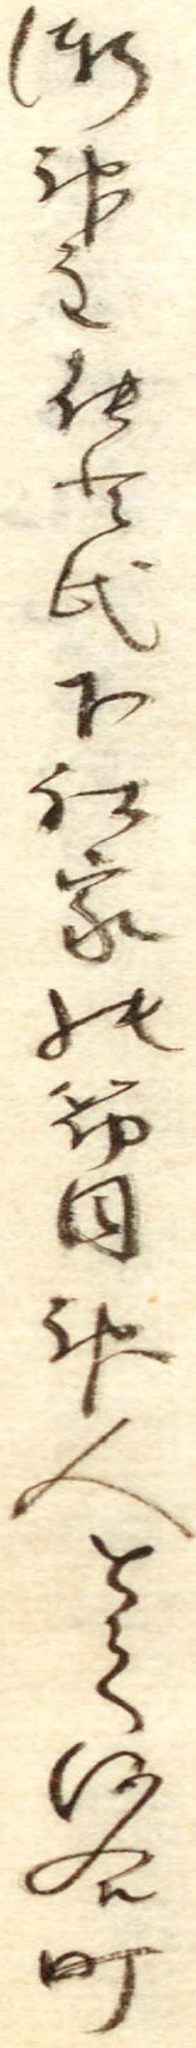漸神主能登氏下社家の筋目神人とて川合町
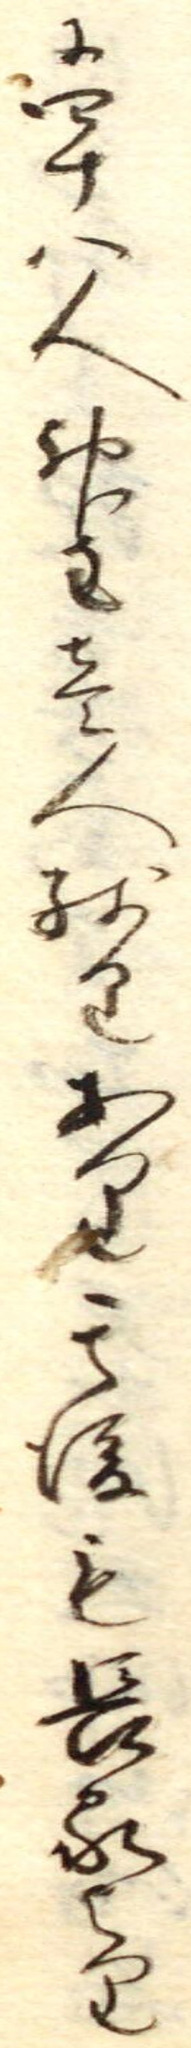に四十八人神主壱人残りあり其後も長家より
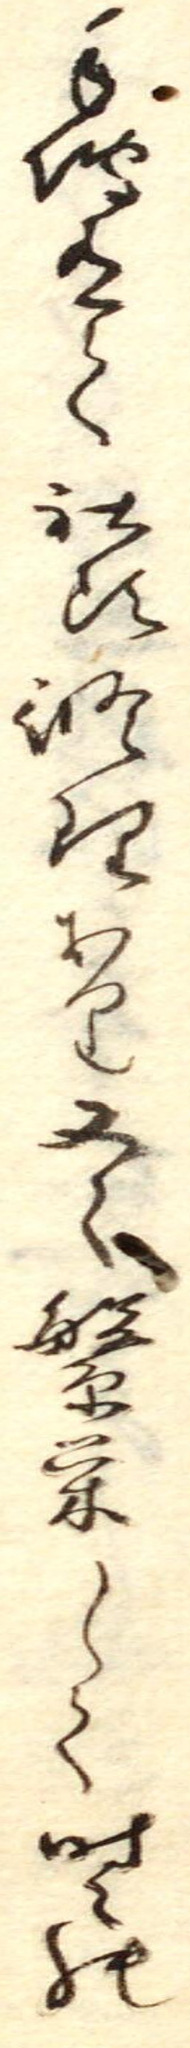手伝有て社頭修理あり又々繁栄して時々の
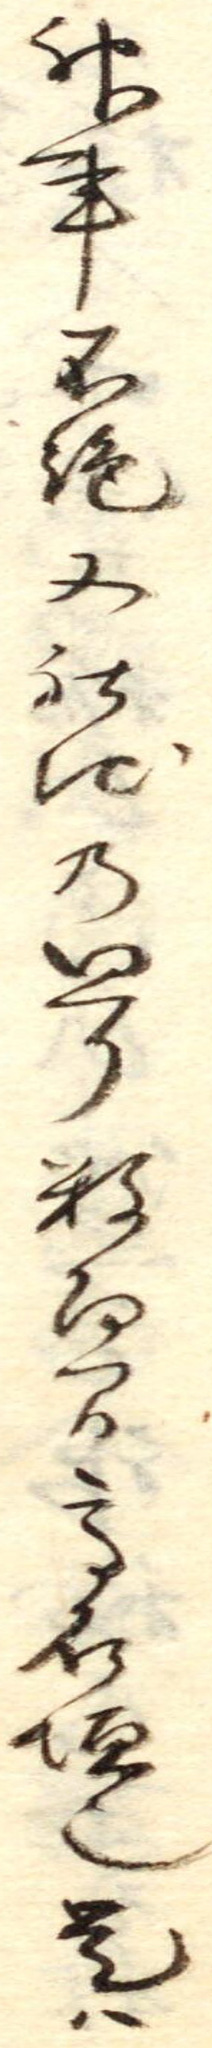神事不絶又社地の廻り数百間高石垣也
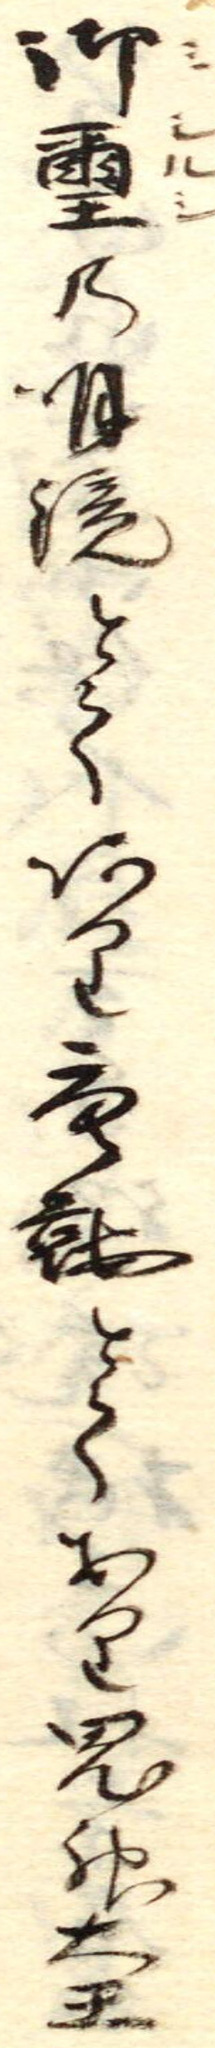御璽明鏡とてあり唐鞍とてあり毘神大王
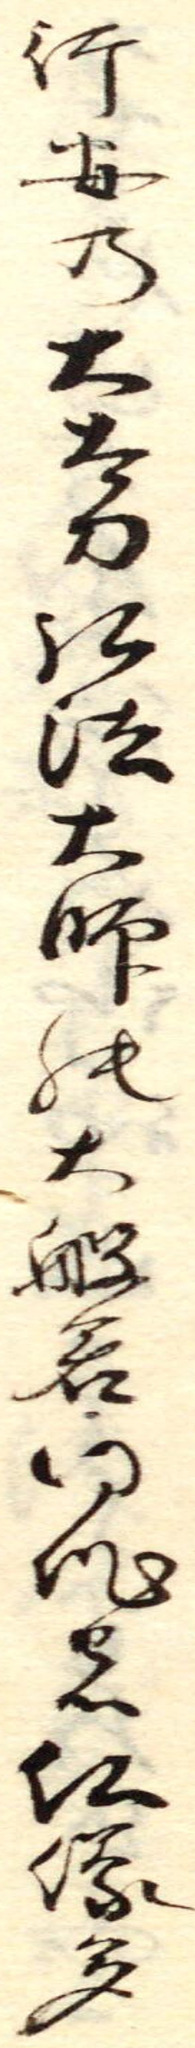行安の大太刀弘法大師の大般若同作の仏像多
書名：能登名跡誌
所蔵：Ishikawa Prefectural Library
